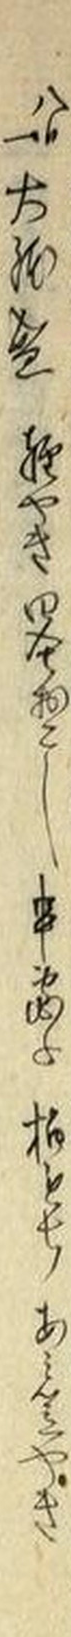一大鉢盛軽やき田舎おこし串団子柏もちあミ笠やき
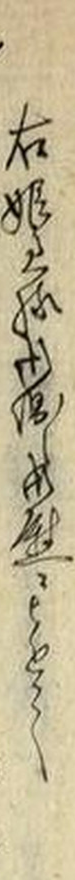右姫君様御側之御慰ニ被進之
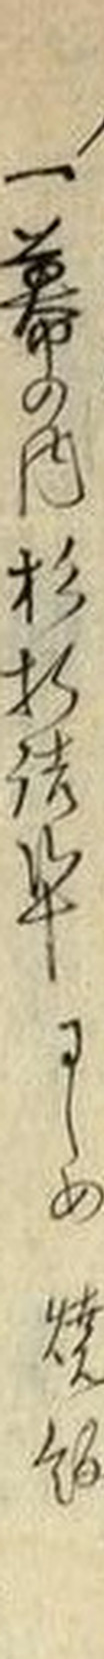一幕の内杉折詰弐十にしめ焼飯
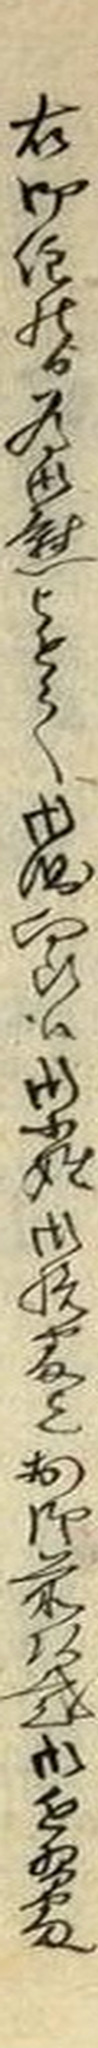右御住居ゟ為御慰被進之御側向頭取御小姓御膳番迄於御前頂戴御近習番
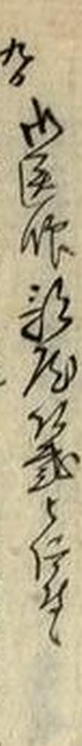御医師部屋頂戴被仰付候
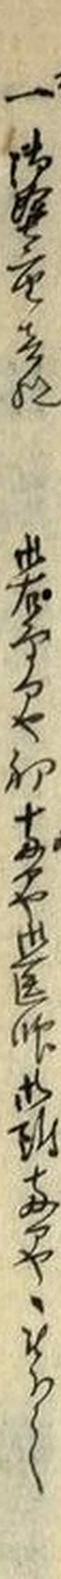一御塗重壱組御右筆部や初両部や御医師御附両部やへ被下之
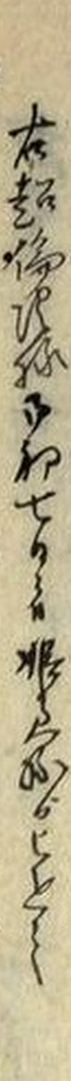右超倫院様御初七日ニ付姫君様ゟ被進之
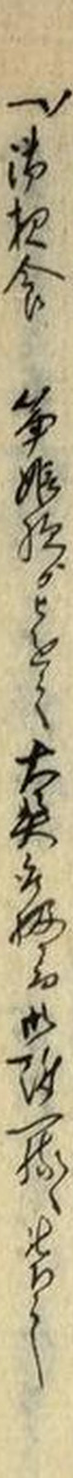一御夜食箏姫様ゟ被進之大奥取扱ニ而御附一統へ被下之
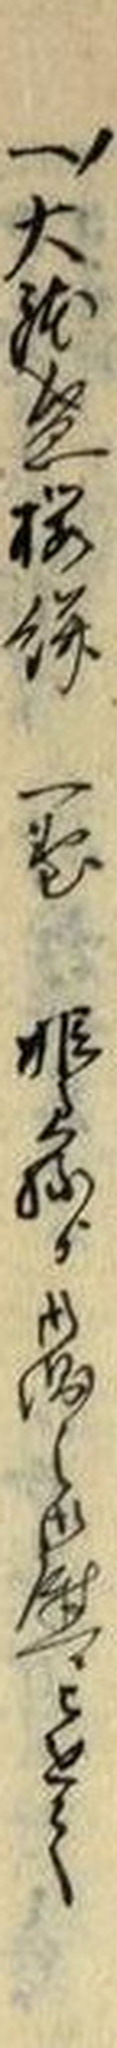一大鉢盛桜餅一台姫君様ゟ御側之御慰ニ被進之

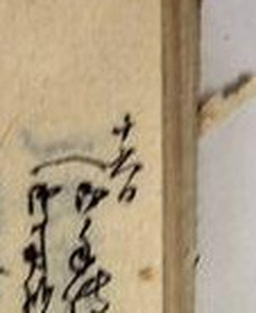十六日
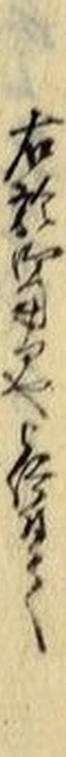右於御用部や被仰付之
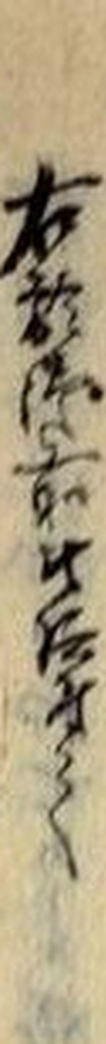右於御前被仰付之
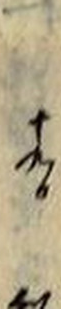十九日
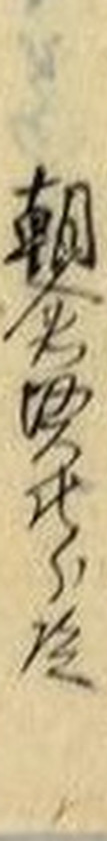朝倉賢次郎殿
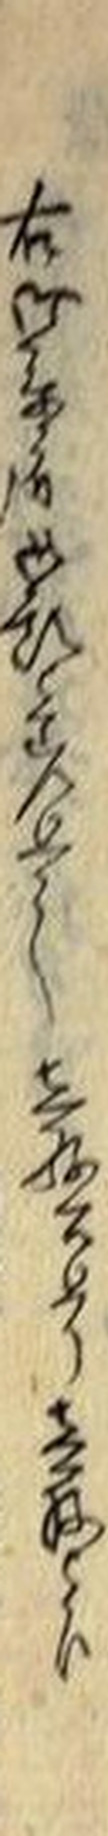右御参府御歓差上之壱枚召上り壱枚被下
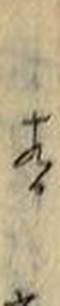十九日
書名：少傅日録抄（斉承付側向頭取日記、在府）
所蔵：福井県文書館 Fukui Prefectural Archives
